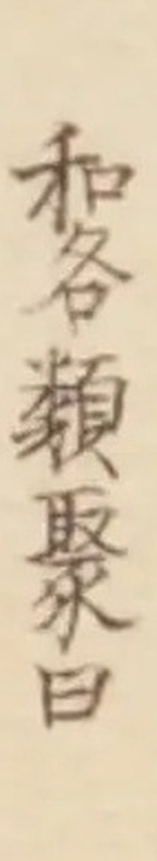和名類聚曰
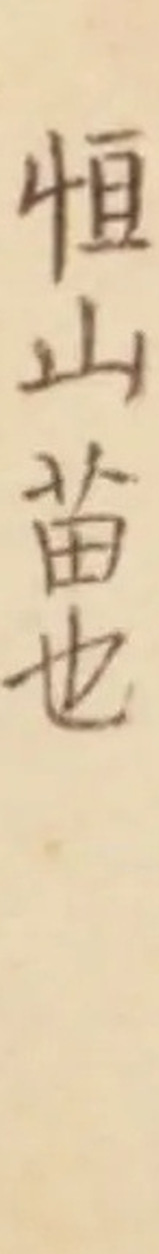恒山苗也
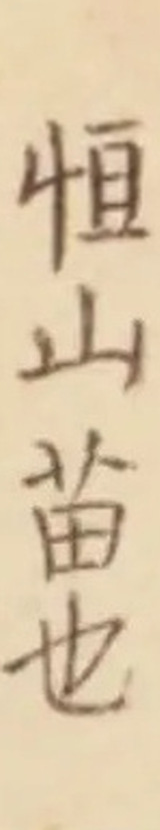恒山苗也
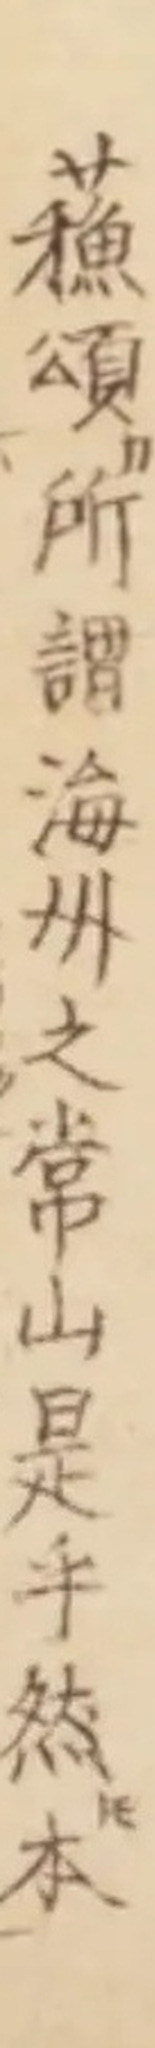蘇頌所謂海州之常山是乎然本

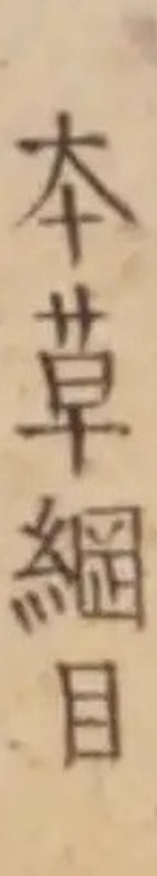本草綱目
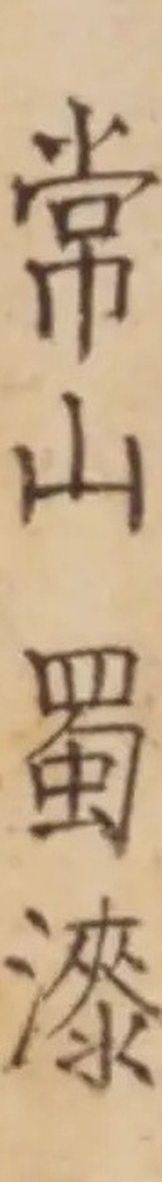常山蜀漆
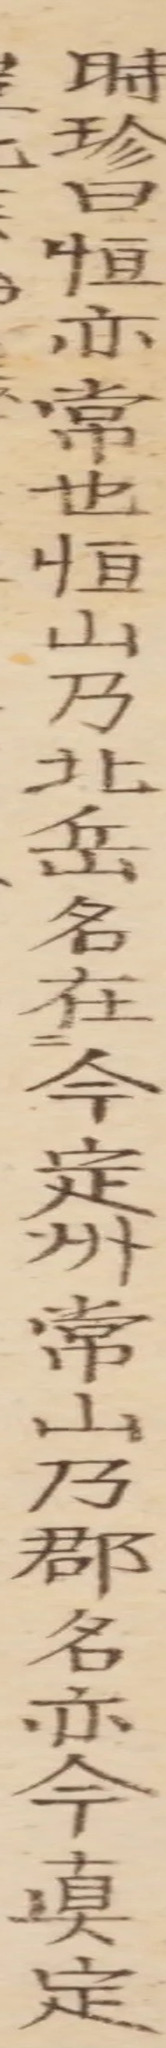時珍曰恒亦常也恒山乃北岳名在今定州常山乃郡名亦今真定
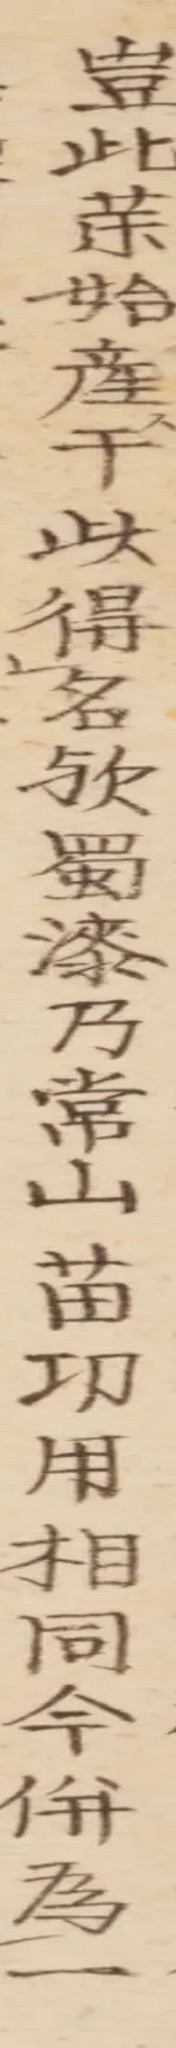豈此薬始産于此得名歟蜀漆乃常山苗功用相同今併為一
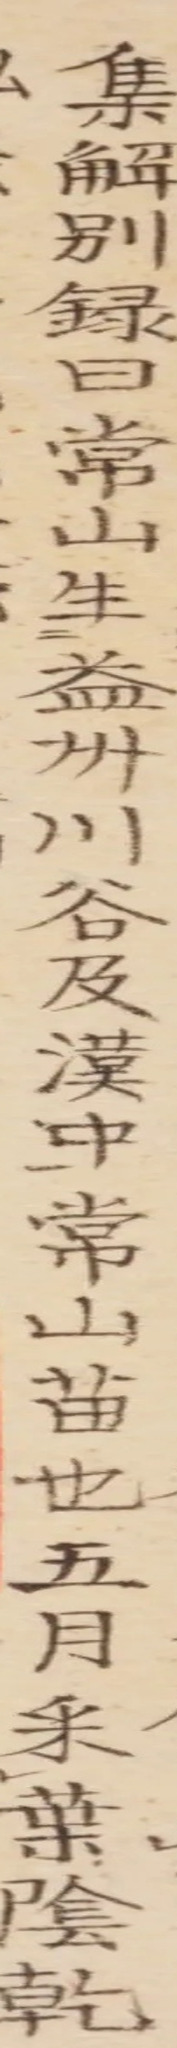集解別録曰常山生益州川谷及漢中常山苗也五月采葉陰乾
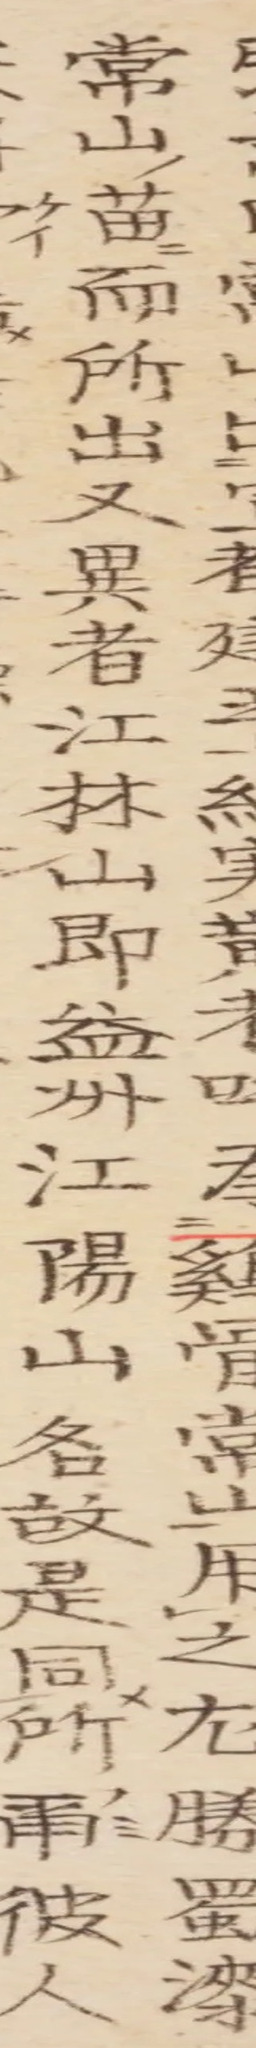常山苗而所出又異者江林山即益州江陽山名故是同シテ所爾彼人
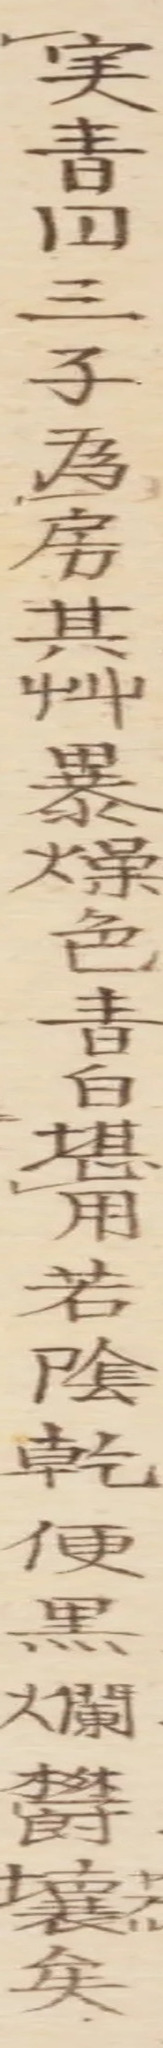実青円三子為房其艸暴燥色青白堪用若陰乾便黒爛鬱壊矣
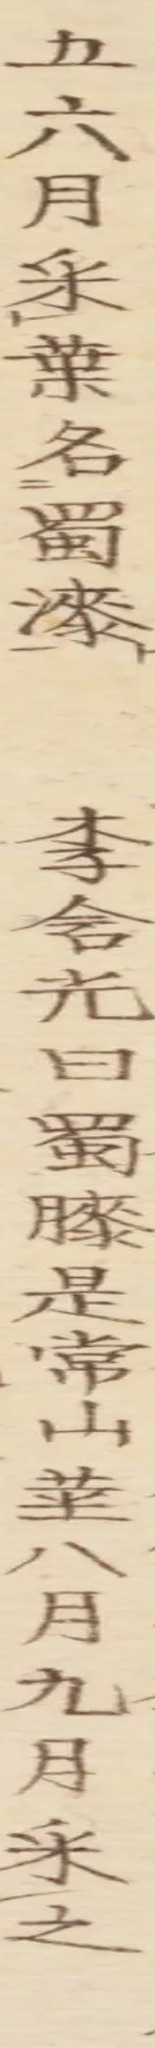五六月采葉名蜀漆李含光曰蜀膝是常山茎八月九月采之
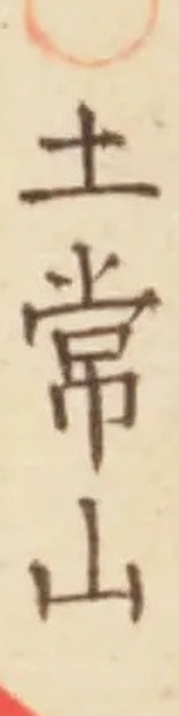土紅山
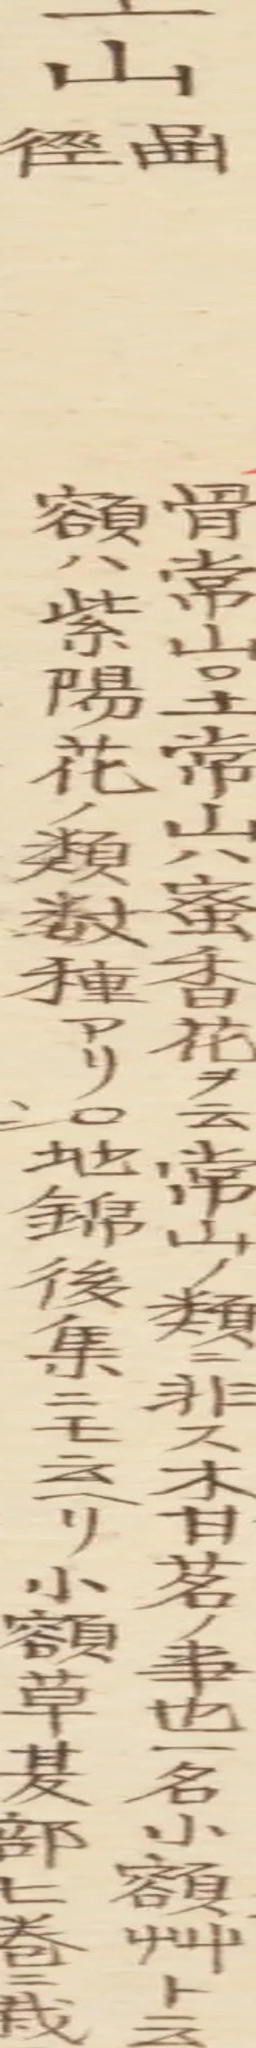𩔜ハ紫陽花ノ類数種アリ◦地錦後集ニモ云ヘリ小𩔜草夏部七巻ニ栽ス
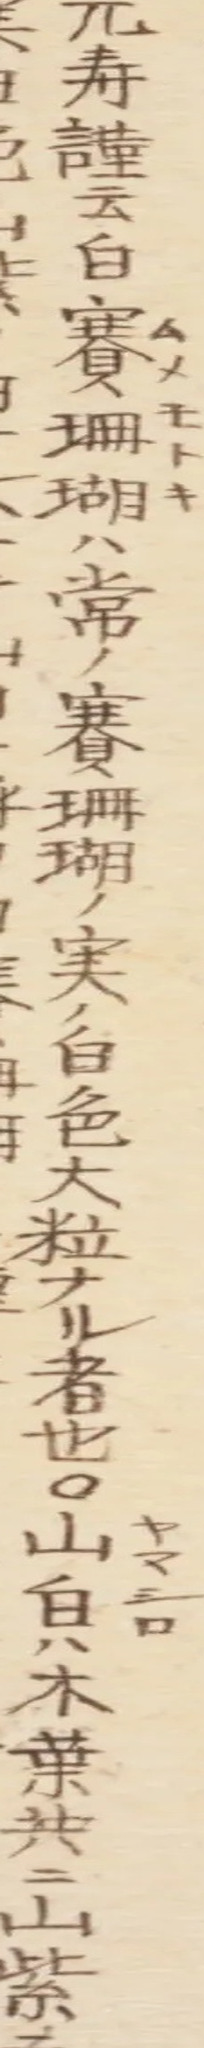▲元寿謹云白賽珊瑚ハ常ノ賽珊瑚ノ実ノ白色大粒ナル者也○山白ハ木葉共ニ山紫ニシテ
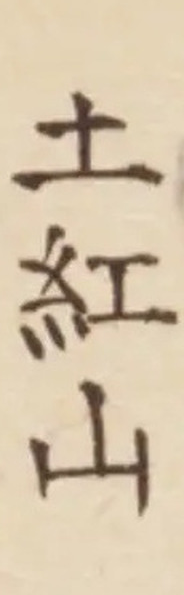土紅山
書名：梅園草木花譜秋之部. 1
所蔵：国立国会図書館 National Diet Library, JAPAN
